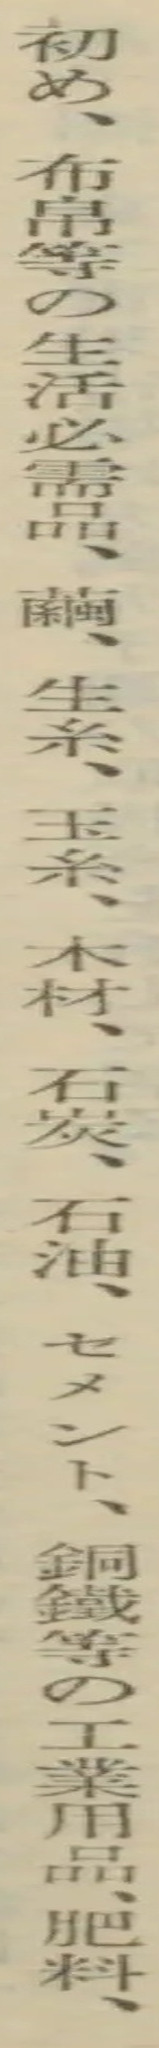初め、布帛等の生活必需品、繭、生糸、玉糸、木材、石炭、石油、セメント、銅鉄等の工業用品、肥料、
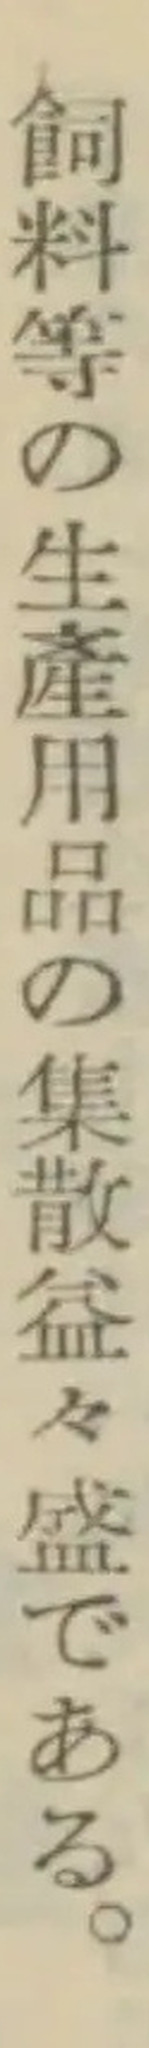飼料等の生産用品の集散益々盛である。
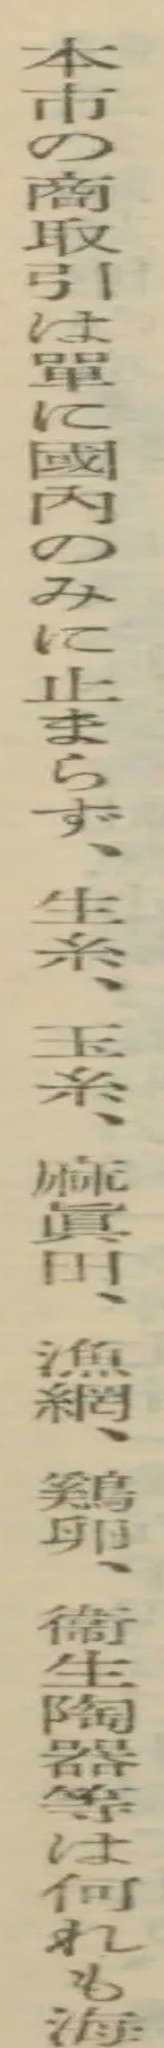本市の商取引は単に国内のみに止まらず、生糸、玉糸、麻真田、漁網、鶏卵、衛生陶器等は何れも海
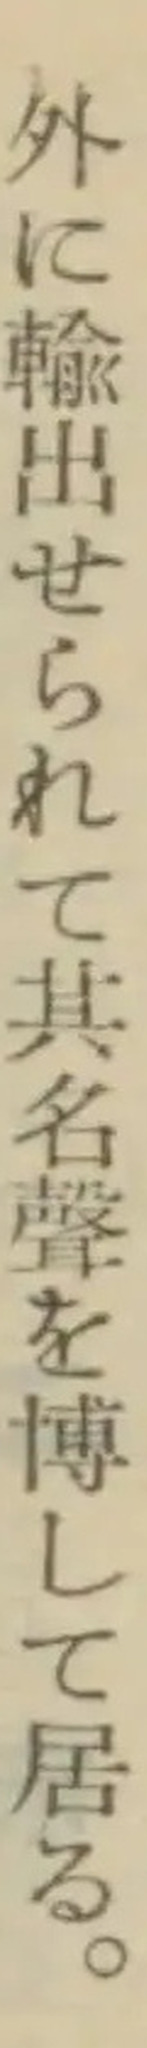外に輸出せられて其名声を博して居る。

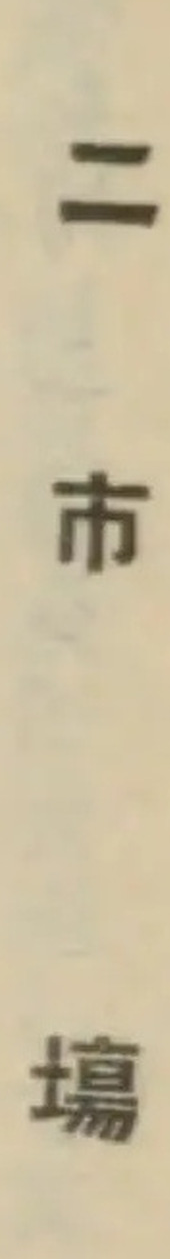二市場
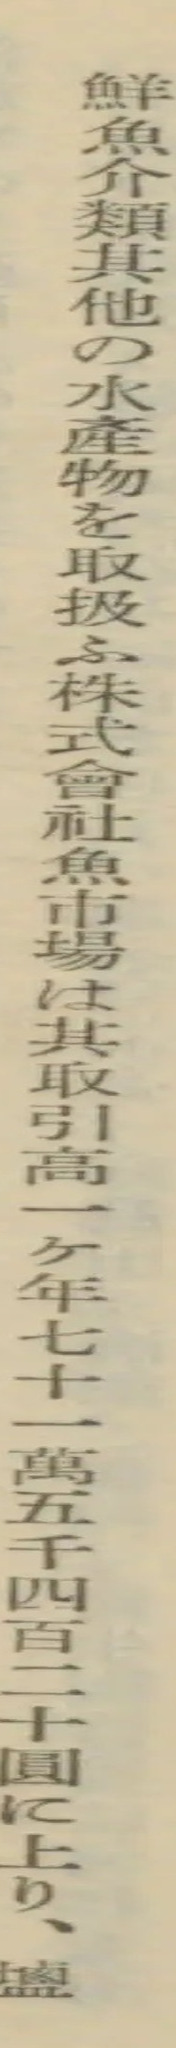鮮魚介類其他の水産物を取扱ふ株式会社魚市場は其取引高一ヶ年七十一万五千四百二十円に上り、塩
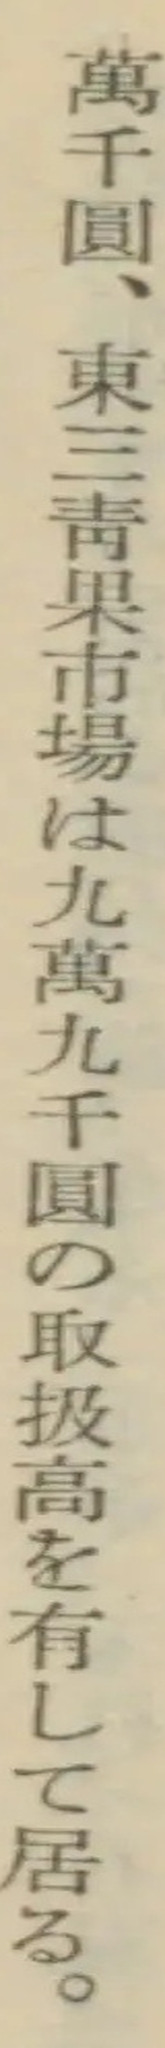万千円、東三青果市場は九万九千円の取引高を有して居る。
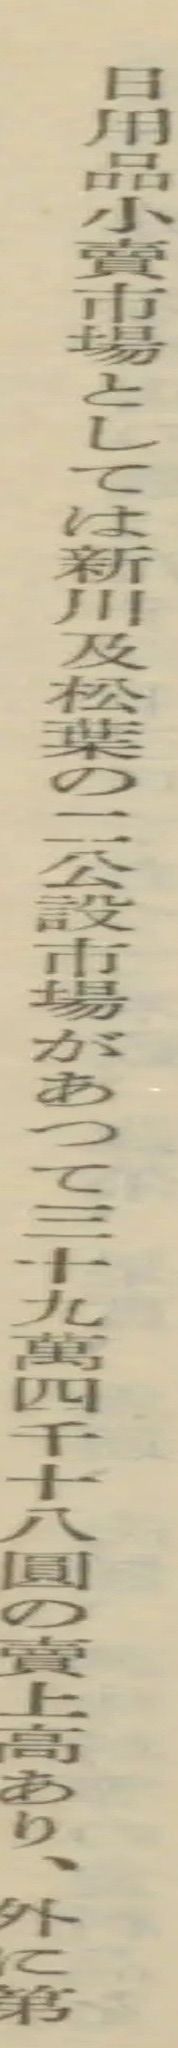日用品小売市場としては新川及松葉の二公設市場があつて三十九万四千十八円の売上高あり、外に第
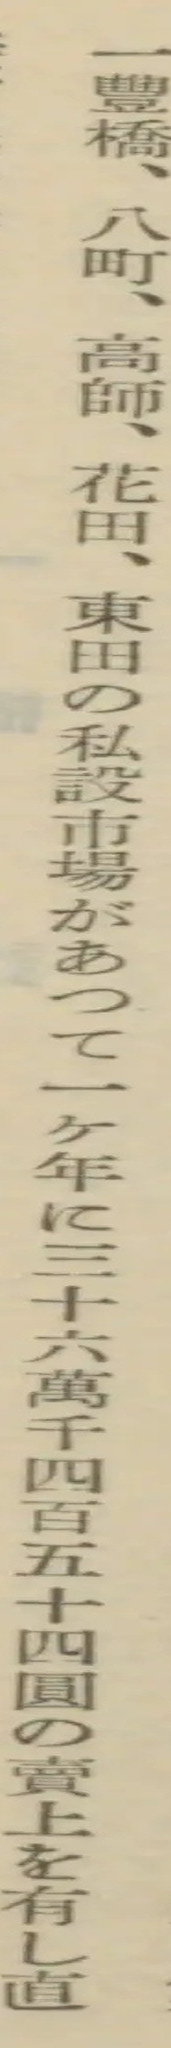一豊橋、八町、高師、花田、東田の私設市場があつて一ヶ年に三十六万千四百五十四円の売上を有し直
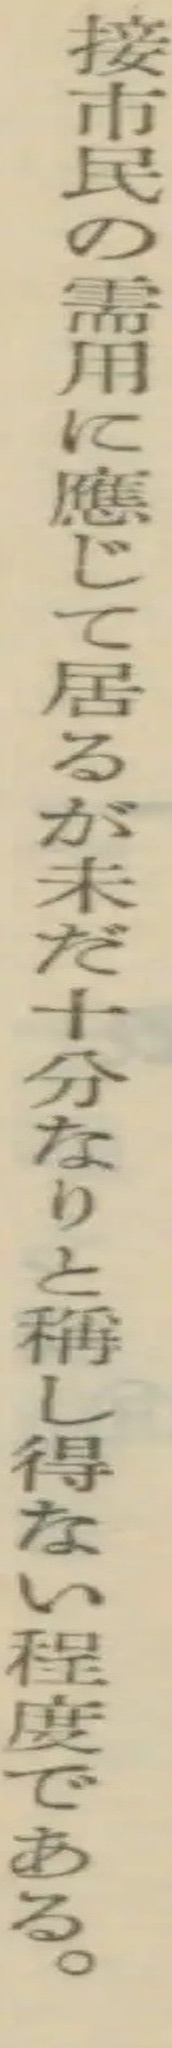接市民の需用に応じて居るが未だ十分なりと称し得ない程度である。
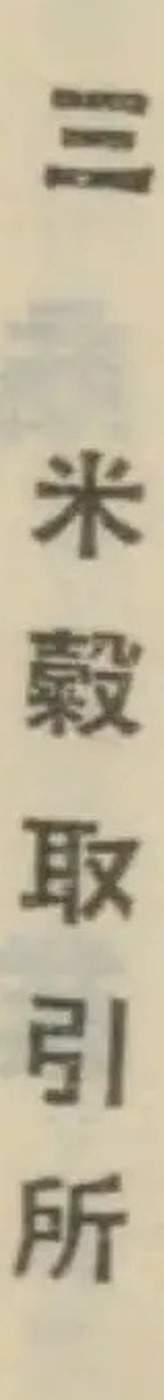三米穀取引所
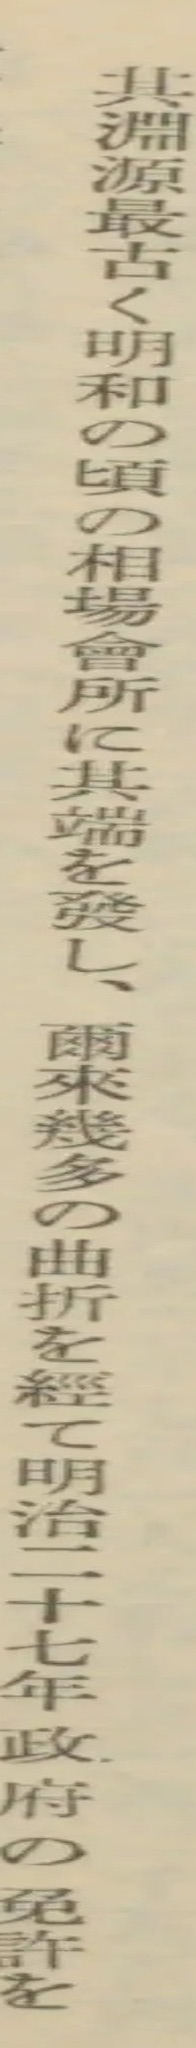其淵源最古く明和の頃の相場会所に其端を発し、爾来幾多の曲折を経て明治二十七年政府の免許を
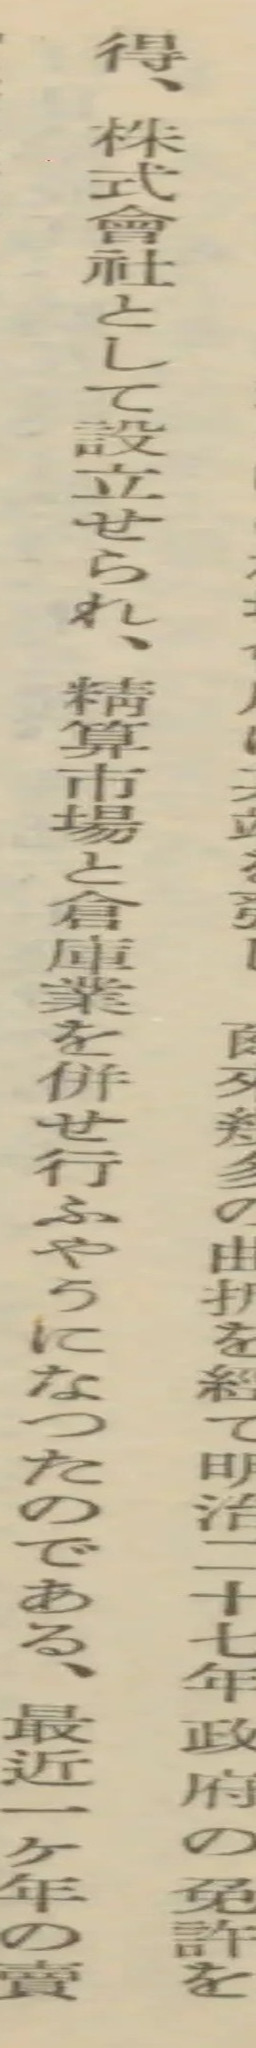得、株式会社として設立せられ、精算市場と倉庫業を併せ行ふやうになつたのである、最近一ヶ年の売
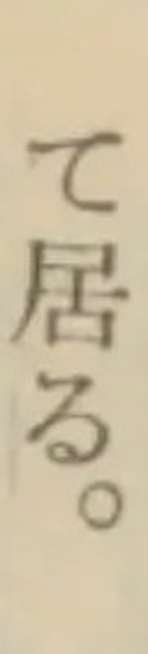て居る。
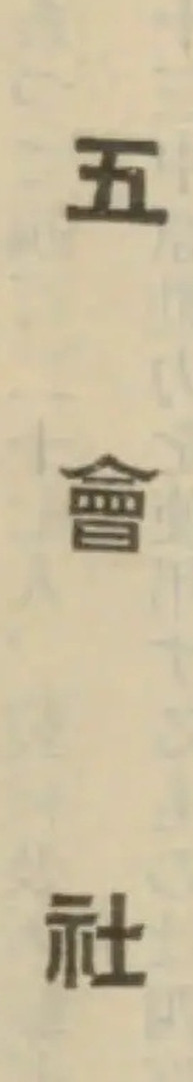五会社
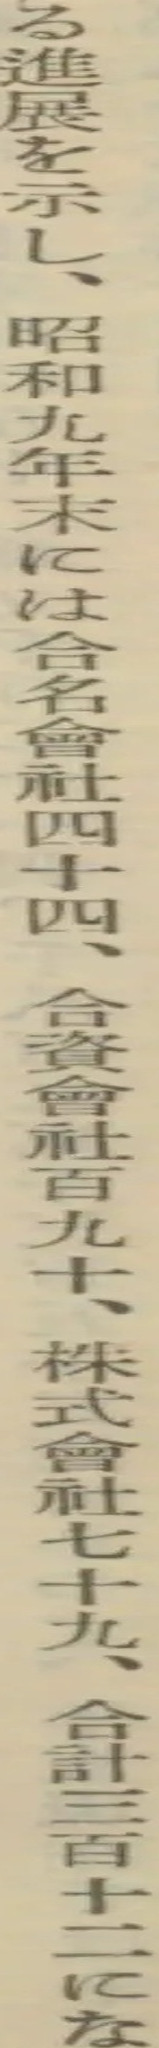る進展を示し、昭和九年末には合名会社四十四、合資会社百九十、株式会社七十九、合計三百十二にな
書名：産業の豊橋
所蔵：国立国会図書館 National Diet Library, JAPAN
